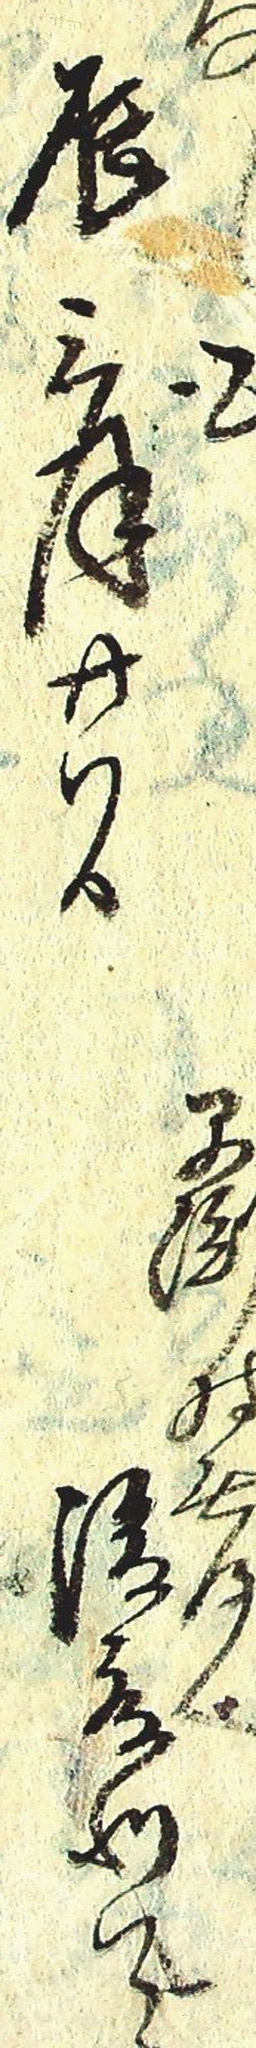辰三月廿八日後藤利八郎

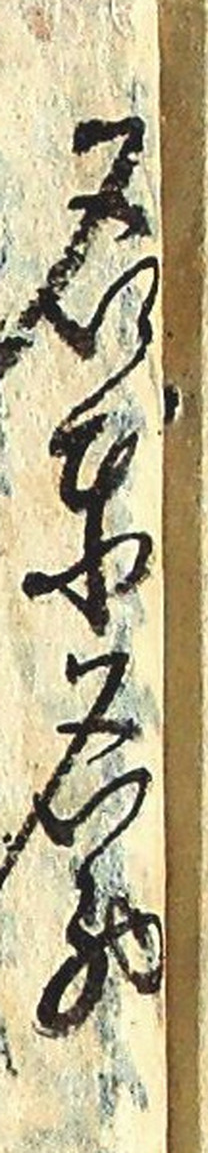名東名西
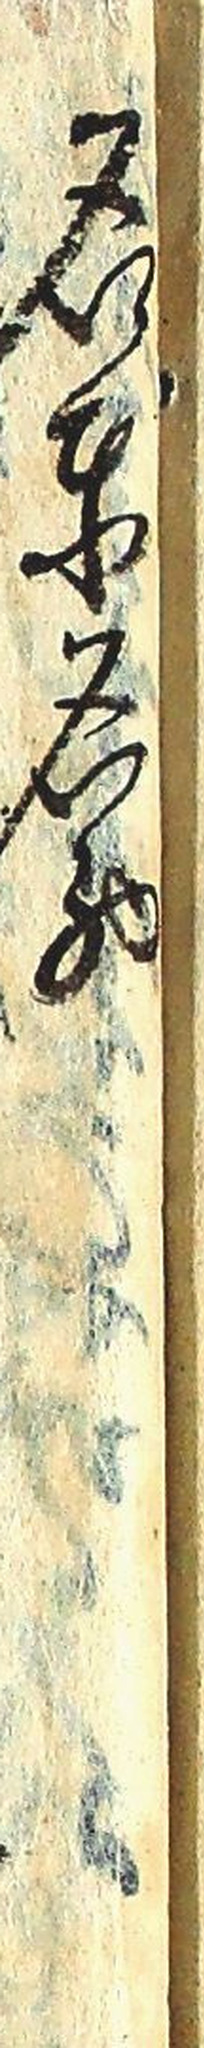名東名西
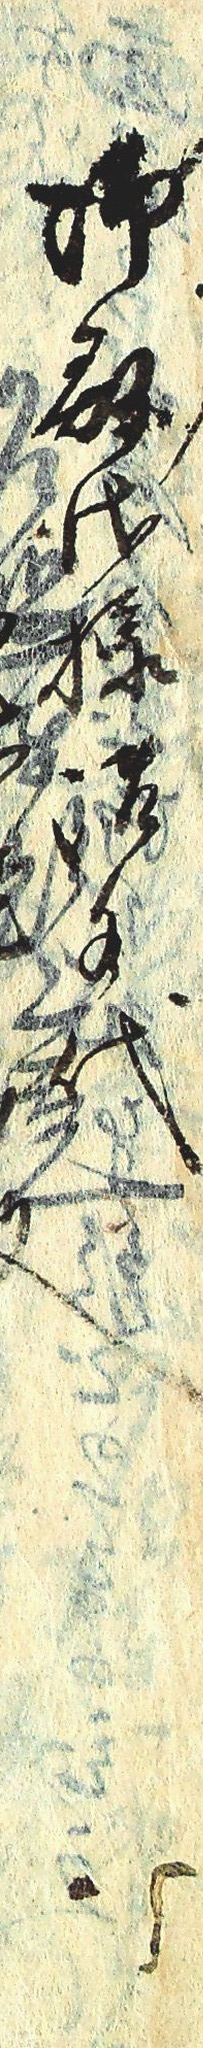御郡代様御手代
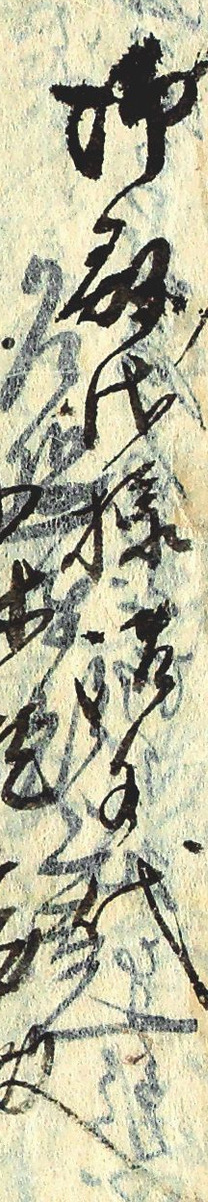御郡代様御手代
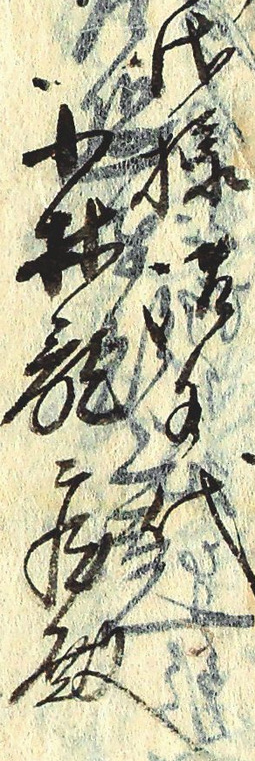小林龍蔵殿
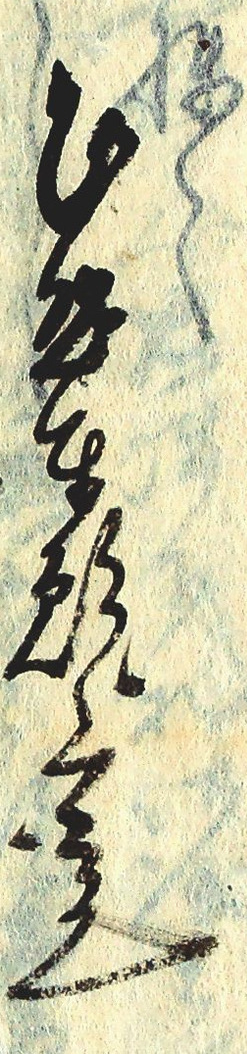乍恐奉願上覚
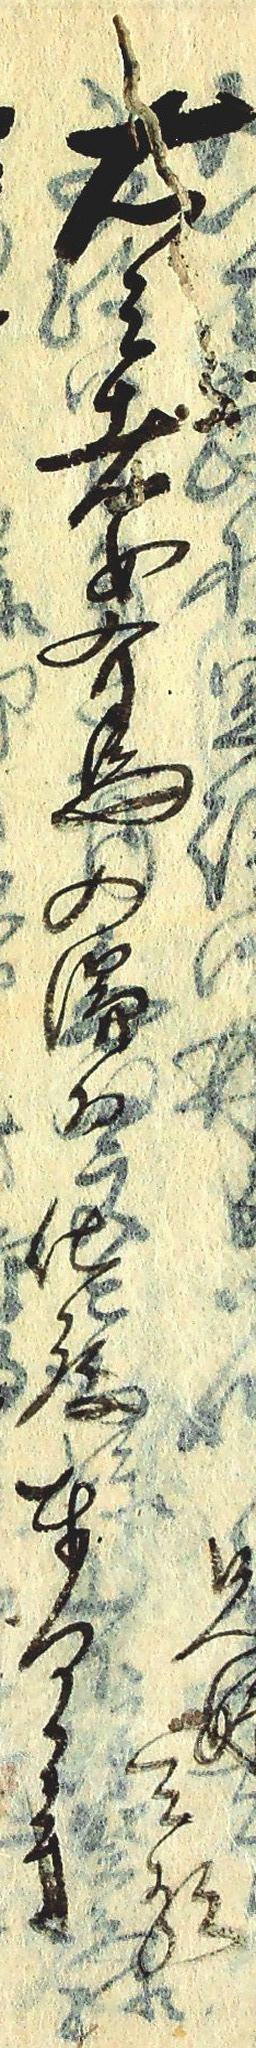右之者義有馬入湯為仕度奉存候に付
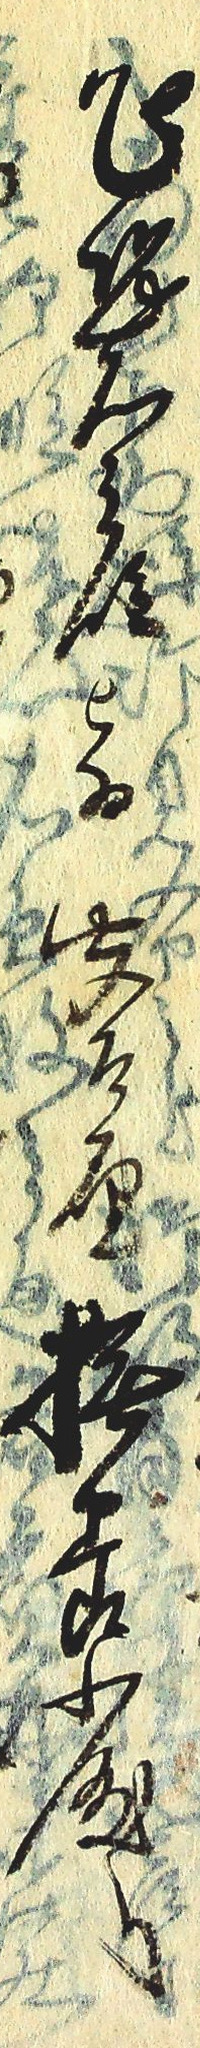乍恐右之段被為聞召届撫養小渡り
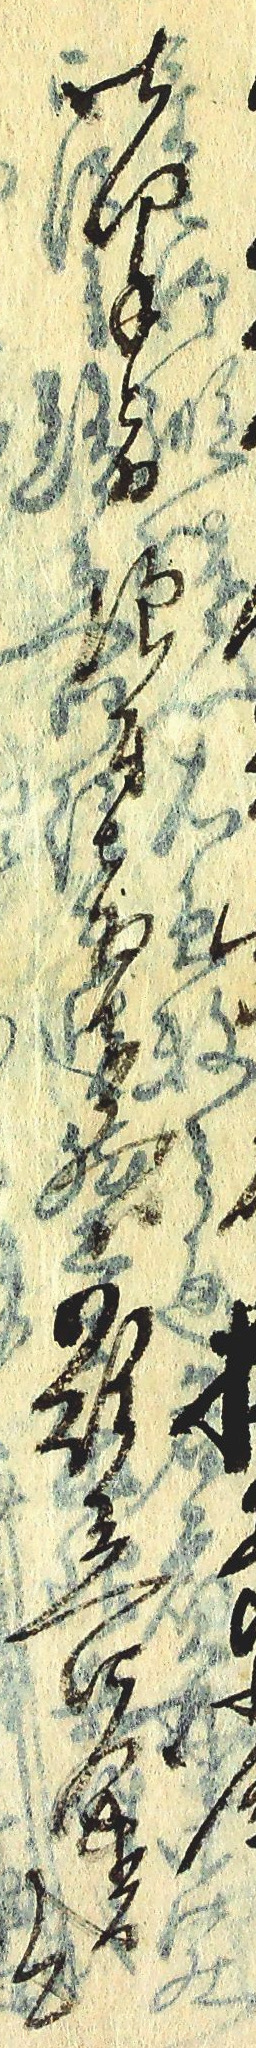御切手被為仰付被為下候はゝ難有仕合奉存
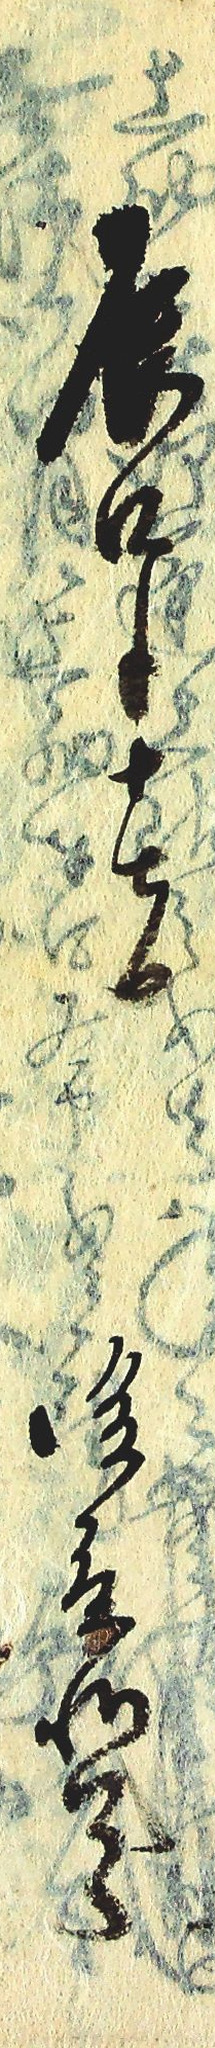辰四月十七日後藤利八郎
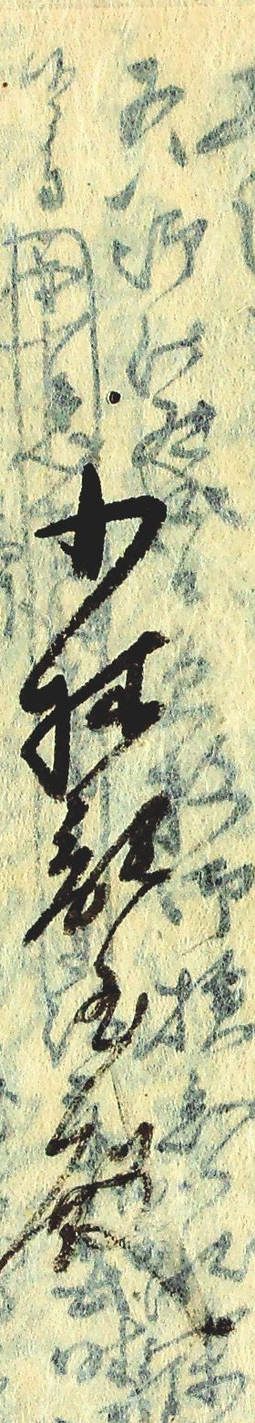小林龍蔵殿
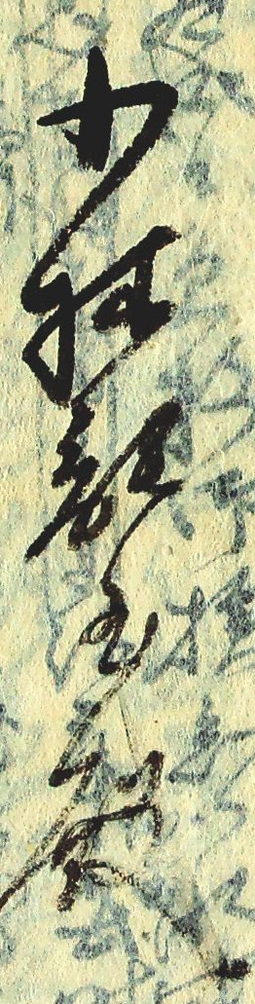小林龍蔵殿

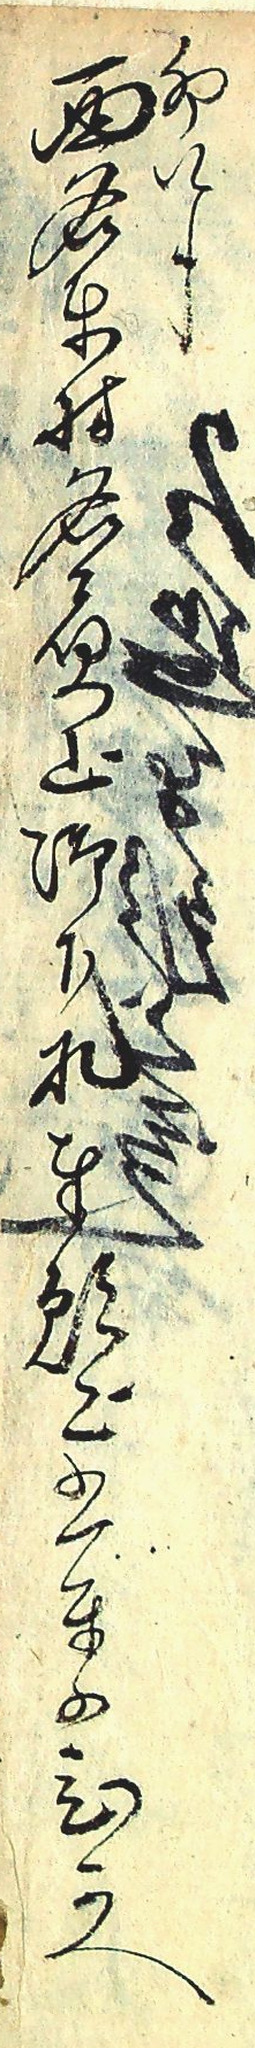西名東村名負山御下札願上書付のひかへ
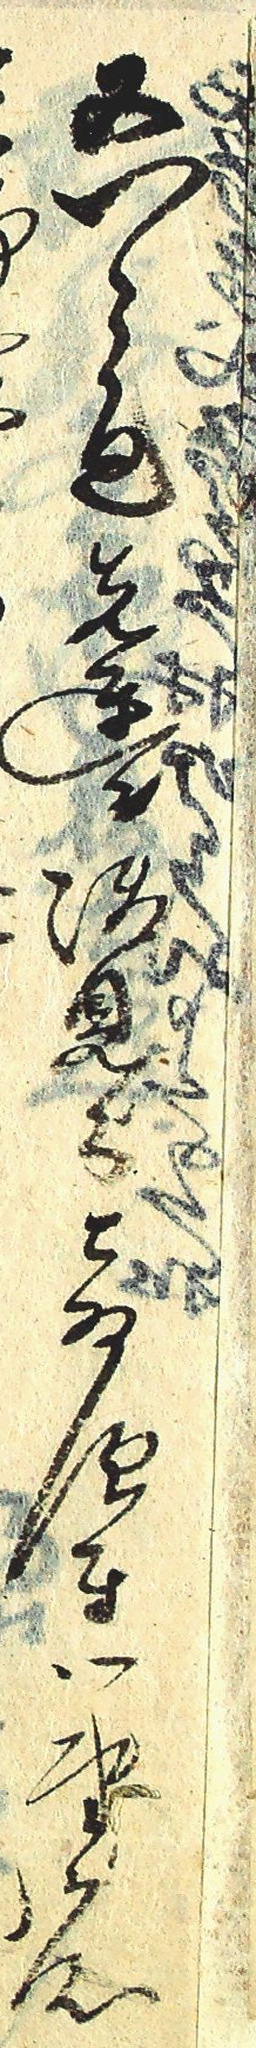右之通先達て御見分被為仰付御座候所
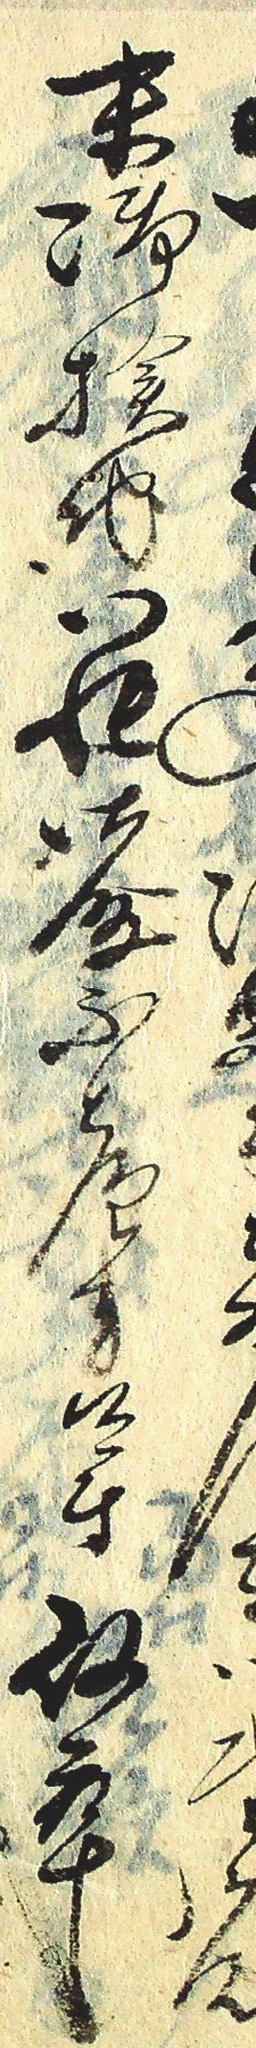未御検地御帳御渡不被仰付候に付何卒
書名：諸御願書控(弐番）
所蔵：鳴門教育大学 Naruto University of Education
